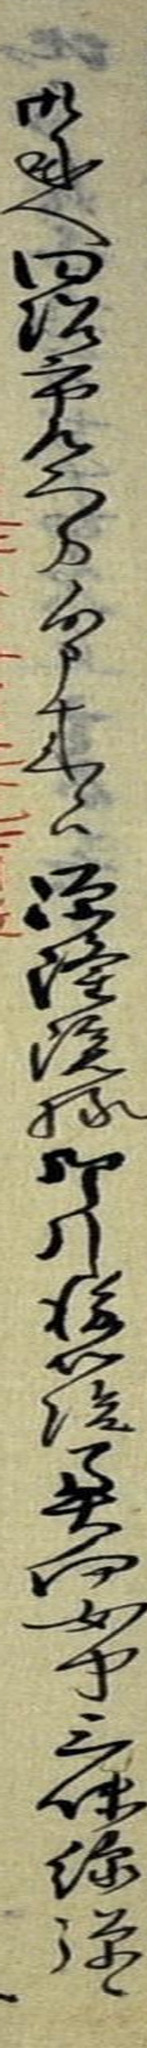御用人田沼市左衛門方ゟ申来候は源隆院様御引移以後奥向女中三味線弾候
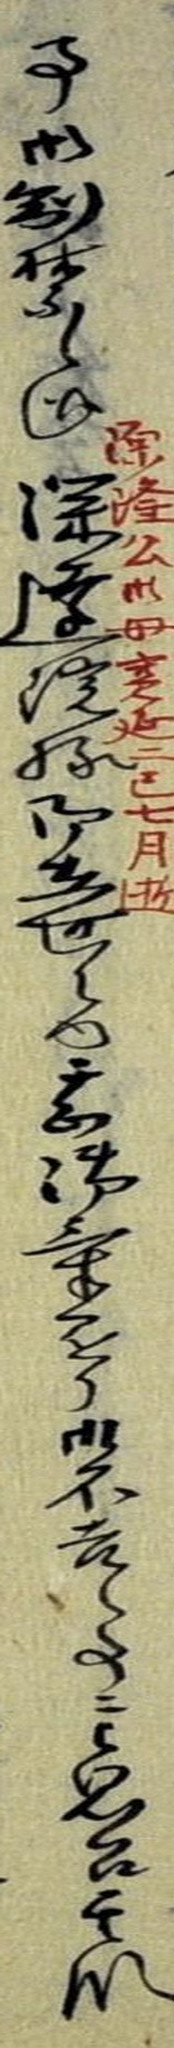事御制禁之趣深達院様御在世之内甚御気懸り御不吉之事に被思召其段
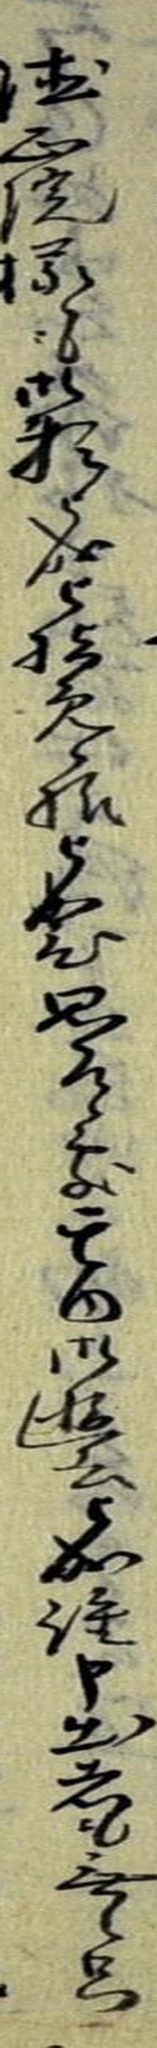徳正院様へも御頼被成被指免候様被成度思召候処其内御逝去被成誰申出者も無之只
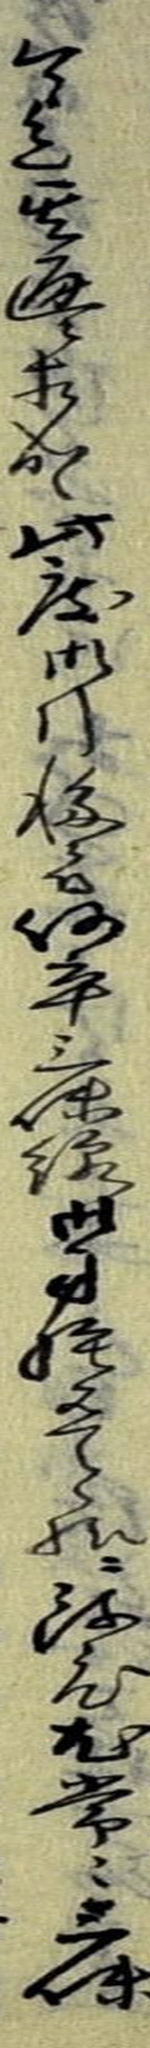今迄其通に相成候此度御引移に付何卒三味線御用捨有之候様に致度尤常々三味
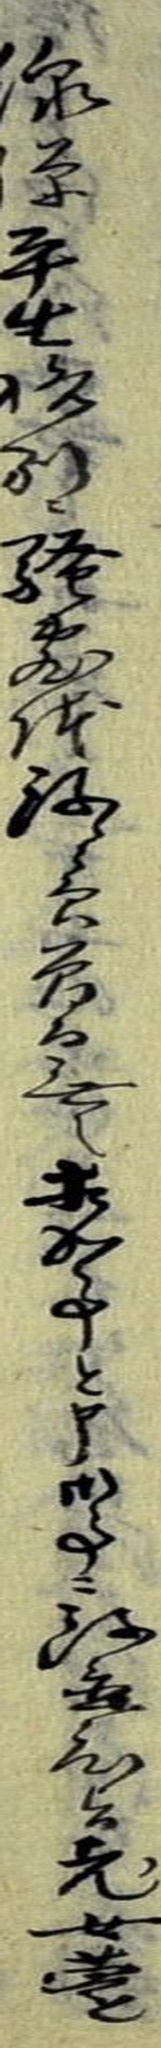線弾平生格別に騒敷体致に而は曽而無之相成事と申御事に致置度旨老女薗
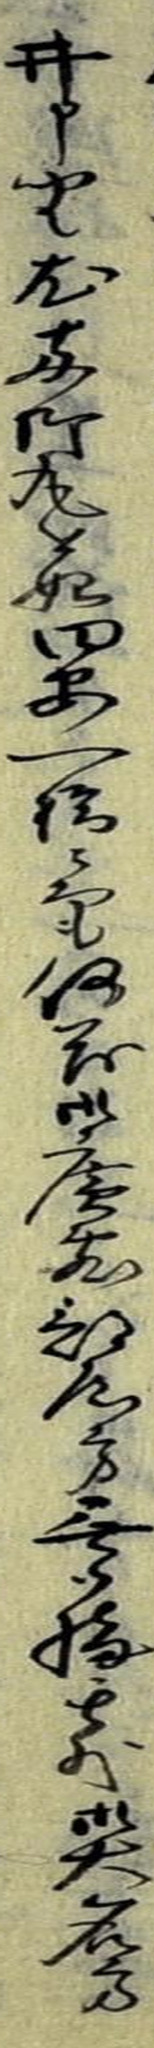井申聞候尤両御丸を始田安一橋に而も何茂御広敷部屋方無御構其外御大名方
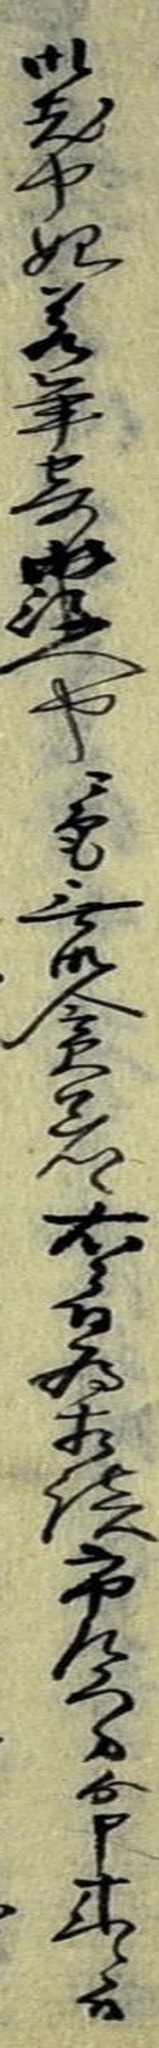御老中始若年寄御役人中に而も無御貪着候右に付為相談市左衛門方ゟ申来候に付
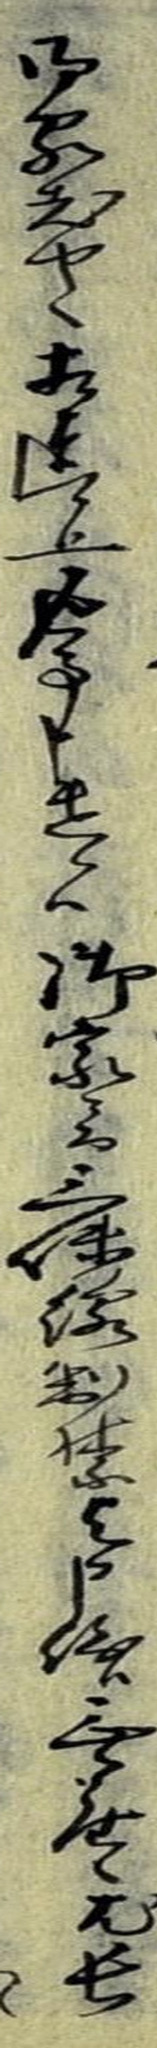御家老中へ相達候上返事申遣候は御家に而三味線制禁与申儀は無御座候尤長
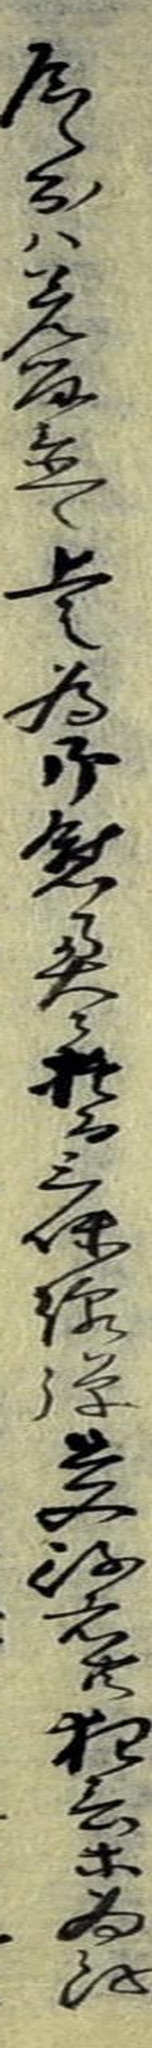屋之分は差留置候上之為御慰奥に於而三味線弾且又役者共狂言等為致候
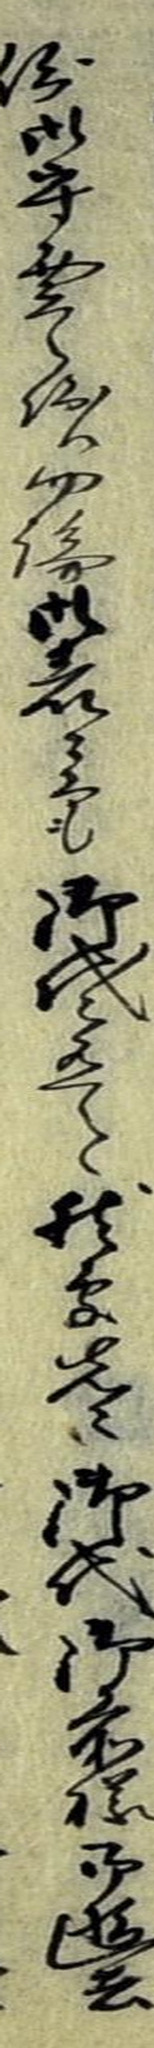儀御守殿之儀は勿論御表に而も御代々有之候然処先々御代御前様御逝去
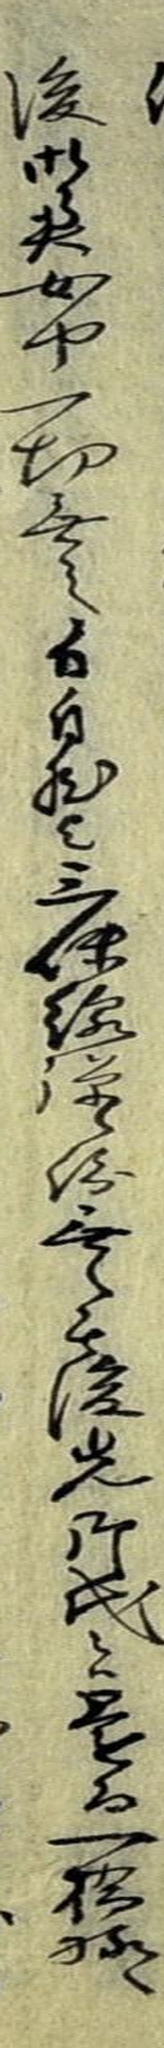後御奥女中一切無之に付自然与三味線弾候儀無之其後先御代々は還而一橋様へ
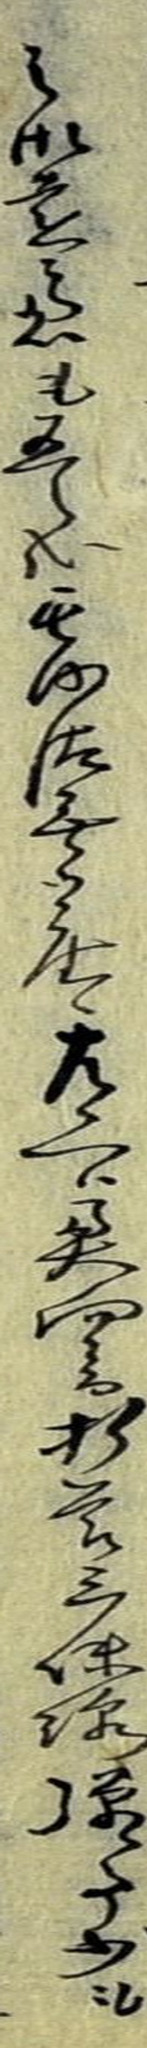之御遠慮も有之哉其沙汰無御座候左候へは奥向に而折節三味線弾候事少も
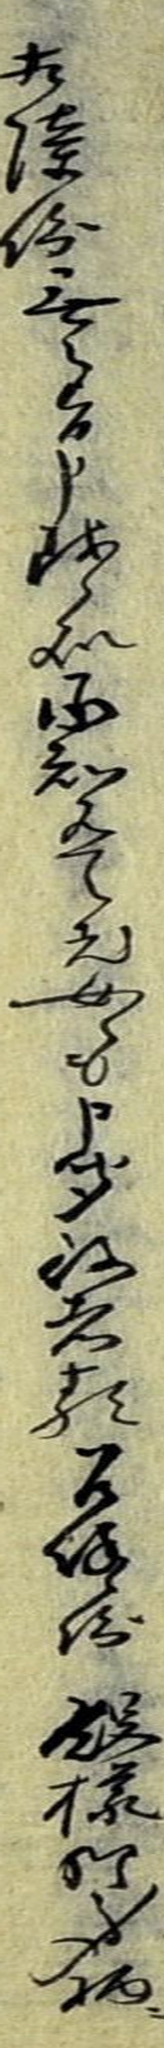相障儀無之旨申越候処承知有之老女へも申聞役者類召呼候儀殿様御身柄に
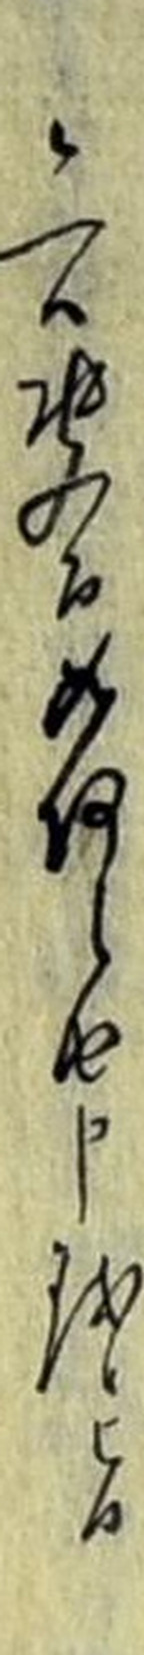候へは決而如何之由申越候旨

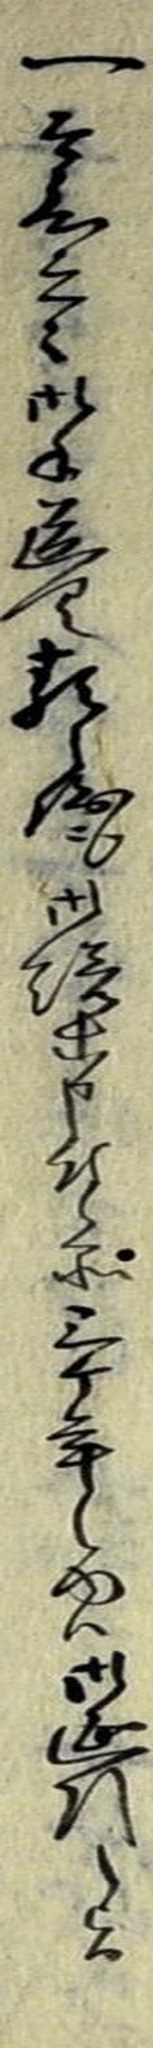一今度云々御手道具類之儀も御続等申付候品三ヶ年之内は御延引之旨
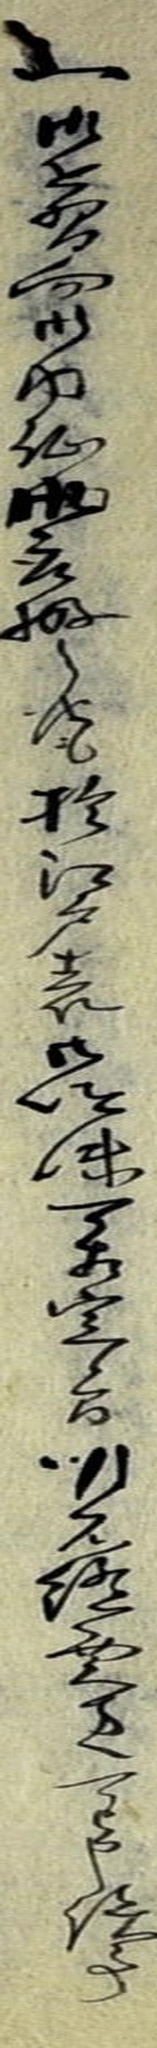一御近習向御内証御取扱之儀も於江戸表御吟味可相定候間明石縫殿方へ可被申談事
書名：命令之部 二
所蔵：福井県文書館 Fukui Prefectural Archives
